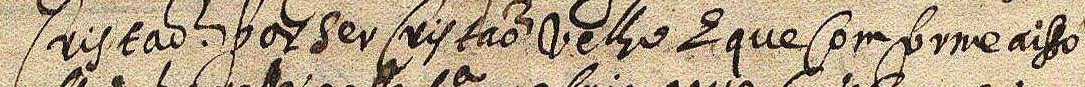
Cristão. por ser Cristaõ velho E que Comforme a isso
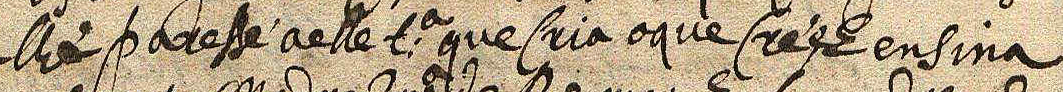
lhe paresse a elle t.a que Cria o que Cree E ensina
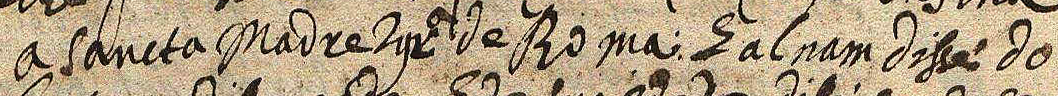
a sancta madre Igra de Roma: E al nam disse do
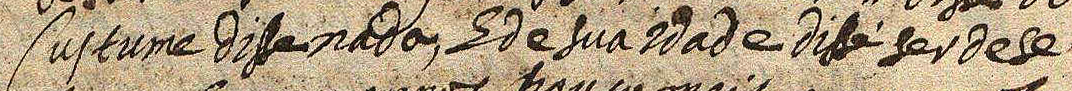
Custume disse nada, E de sua idade disse ser de se
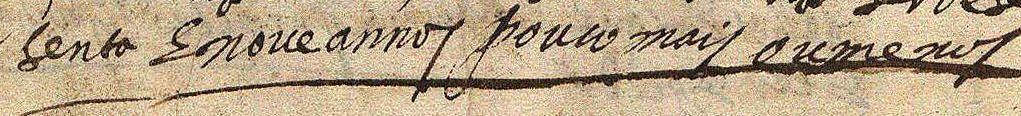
senta E noue annos pouco mais ou menos
